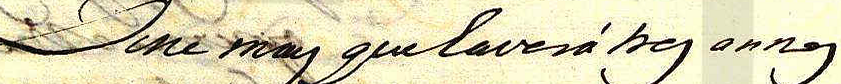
Disse mais que haverá tres annos
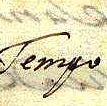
Tempo
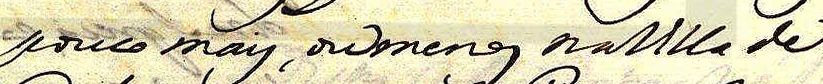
pouco mais, ou menos na Villa de
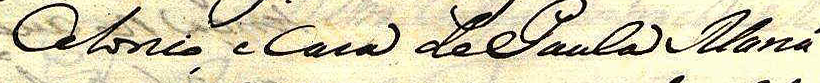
Celorico, e Caza de Paula Maria
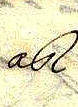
a R
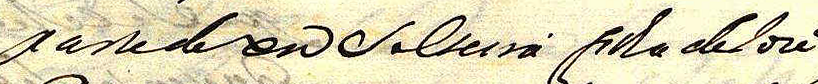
parte de xn solteira filha de Iozé
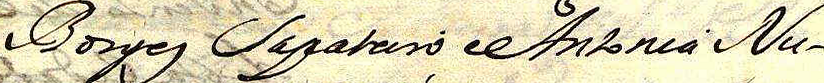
Borges Sapateiro, e Antonia Nu
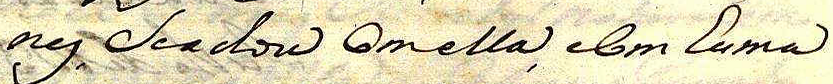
nes, se achou com ella, e com huma
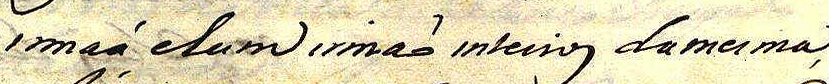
irmaã, e hum irmaõ inteiro da mesma,
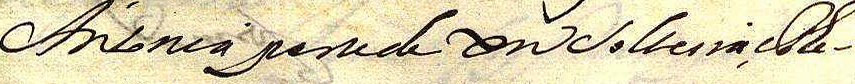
Antonia parte de xn solteira, e The
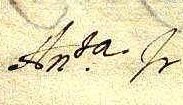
An.ta Jr
